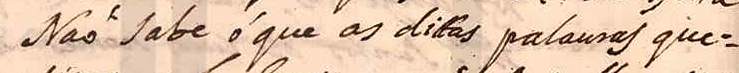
Naõ sabe ó que as dittas palauras que
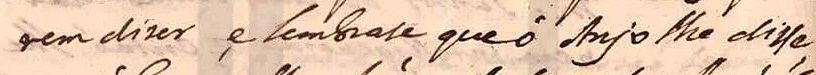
rem dizer, e lembrase que ó Anjo lhe disse
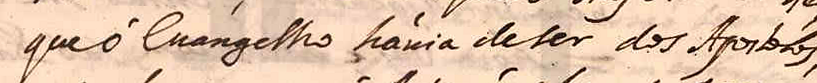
que ó Euangelho hauia de ser dos Apostolos,
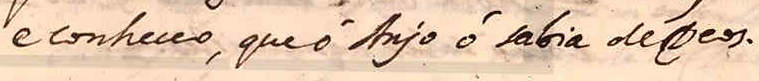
e conheceo, que ó Anjo ó sabia de Deos.
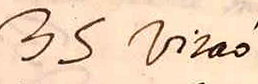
35 Vizaõ
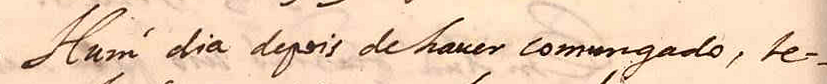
Hum dia depois de hauer comungado, te
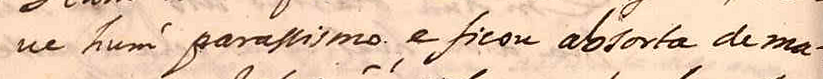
ue hum parassismo, e ficou absorta de ma
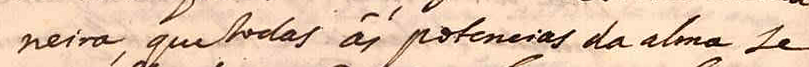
neira, que todas ás potencias da alma se
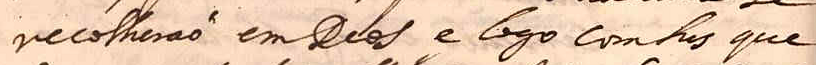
recolheraõ em Deos, e logo com lus que
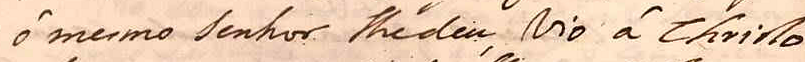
ó mesmo Senhor lhe deu, vio á Christo
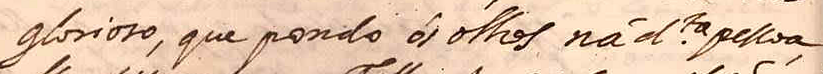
gloriozo, que pondo ós olhos na d.ta pessoa,
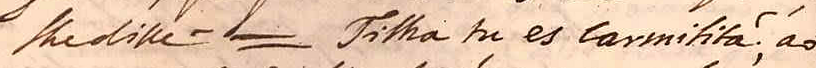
lhe disse = Filha tu es carmilita; aó
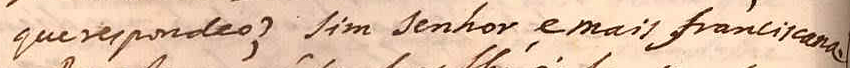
que respondeo, sim senhor, e mais franciscana.
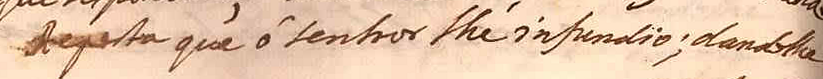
Reposta que ó senhor lhe infundio, dandolhe
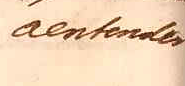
a entender
